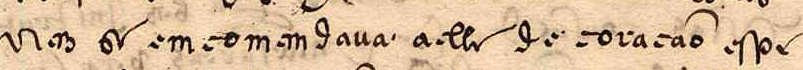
nem se emcomemdaua a elle de coraçaõ espe
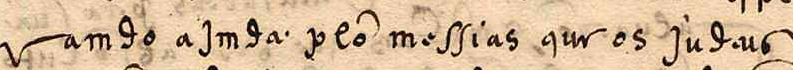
ramdo aJmda plō messias que os Judeus
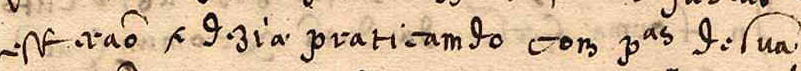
esperaõ e dezia praticamdo com pas de sua
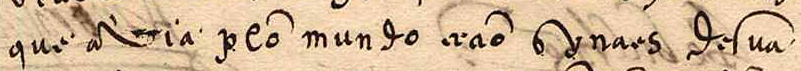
que avia plō mundo eraõ synaes de sua
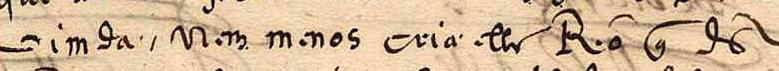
vimda / nem menos cria elle Reō q̄ ds̄
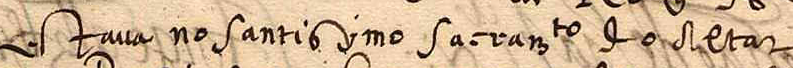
estaua no Santisymo Sacramto do Altar
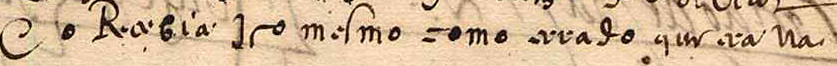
e o Recebia Jso mesmo como errado que era na
